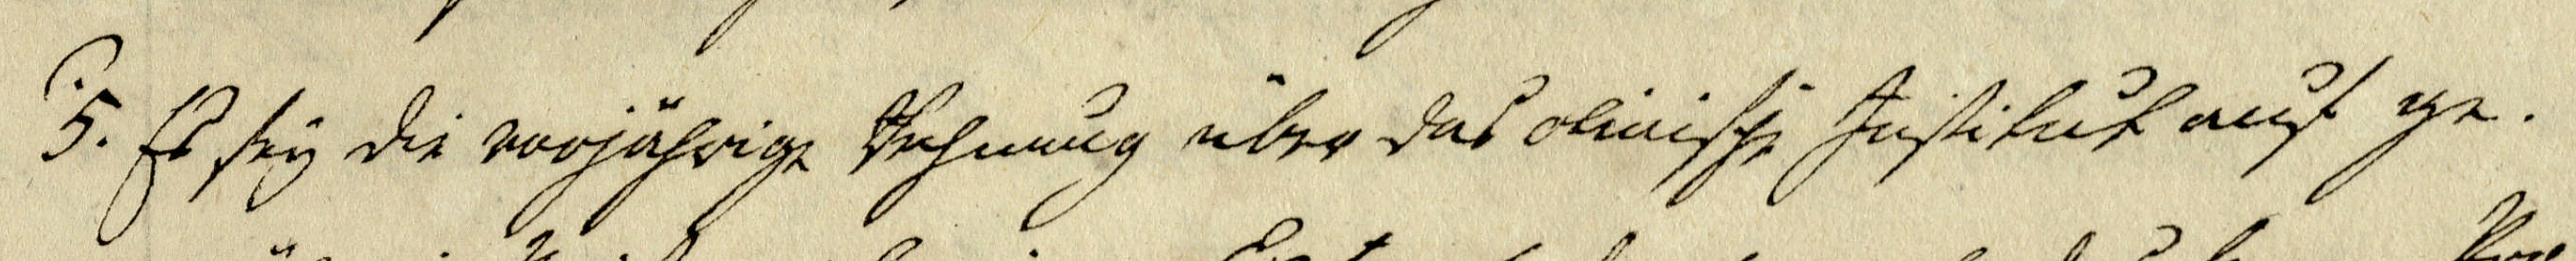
5. Es seÿ die vorjährige. Rechnung über das clinische Institut auf ge¬
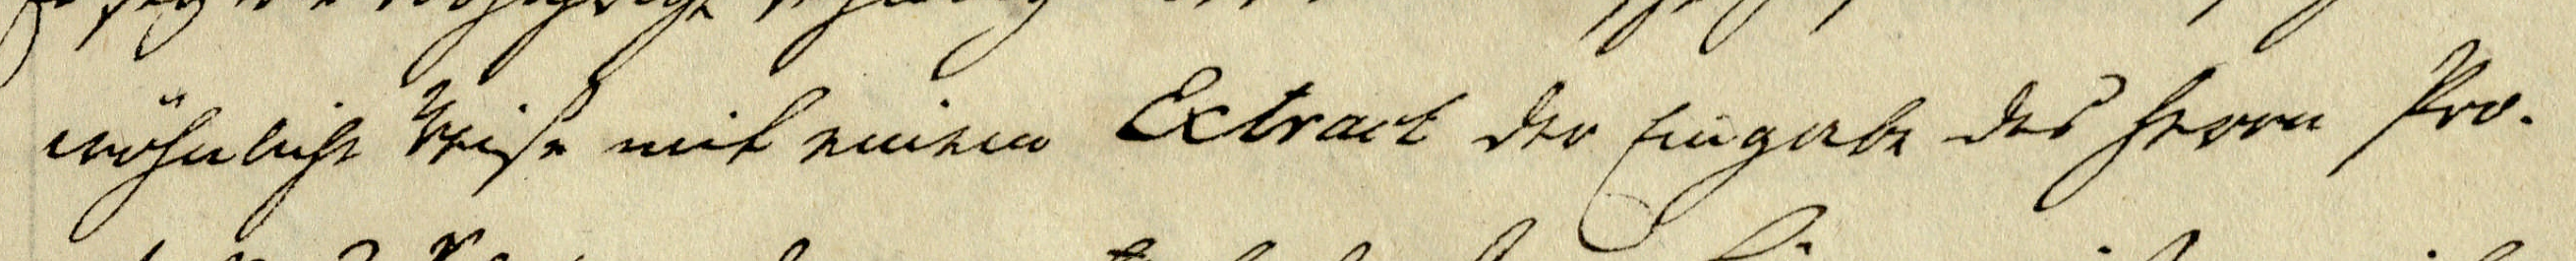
wöhnliche Weise mit einem Extract der Eingabe des Herrn Pro¬
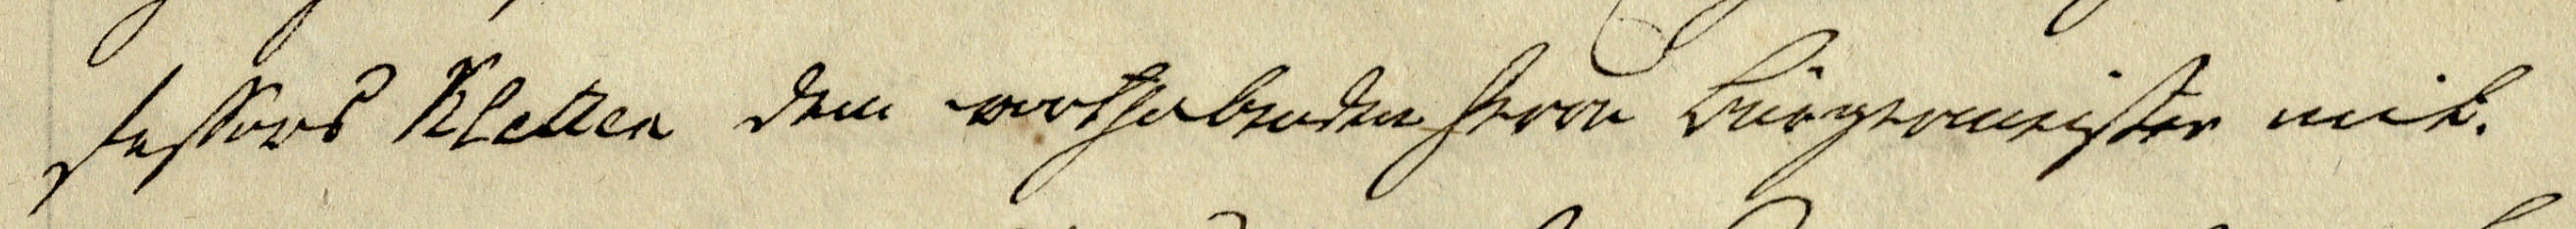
fessors Kletten dem worthabenden Herrn Bürgermeister mit¬
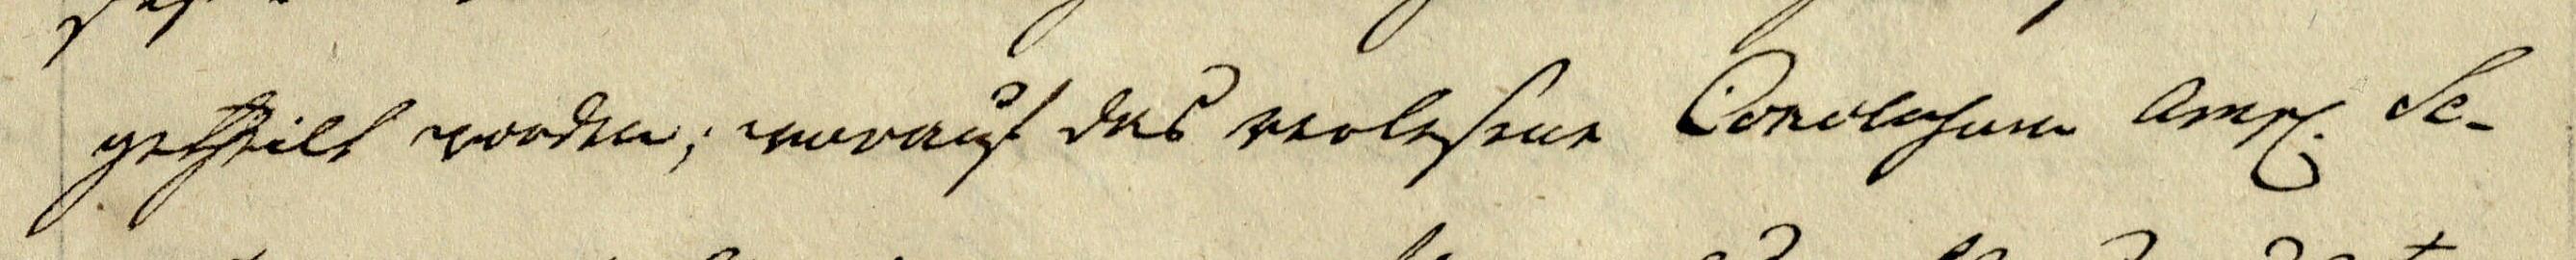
getheilt worden; worauf das verlesene Conclusum Amp. Se¬
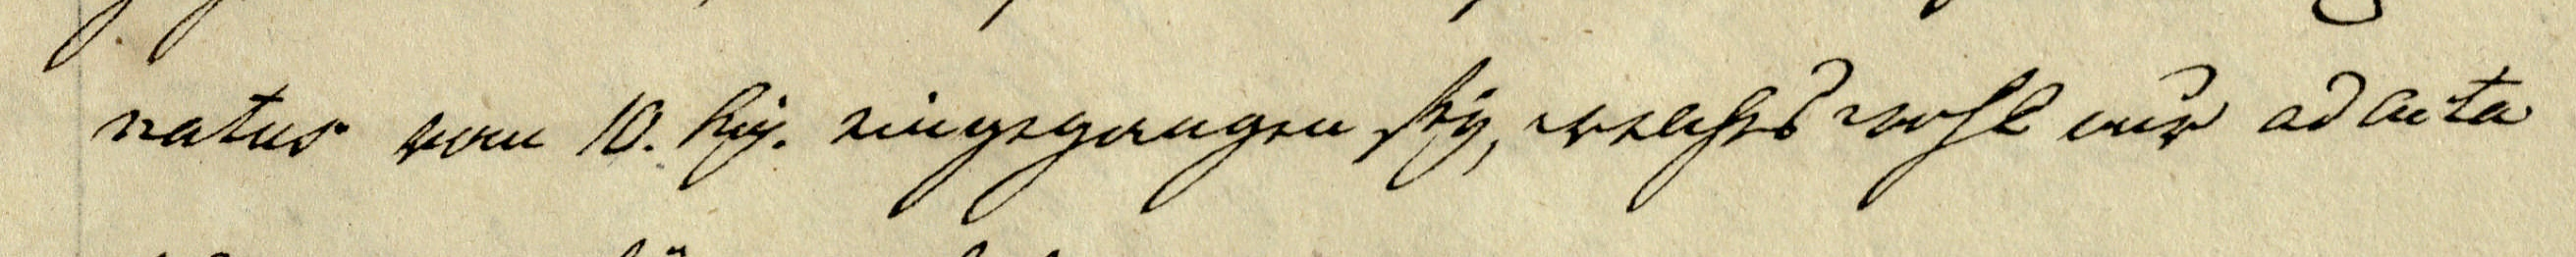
natus vom 10. huj. eingegangen seÿ, welches wohl nur ad Acta
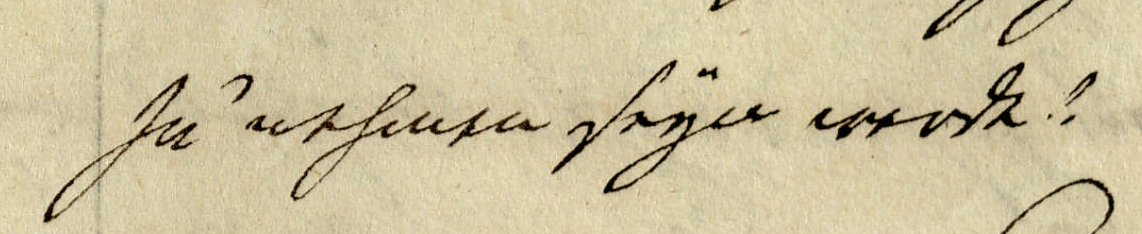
zu nehmen seÿn werde?
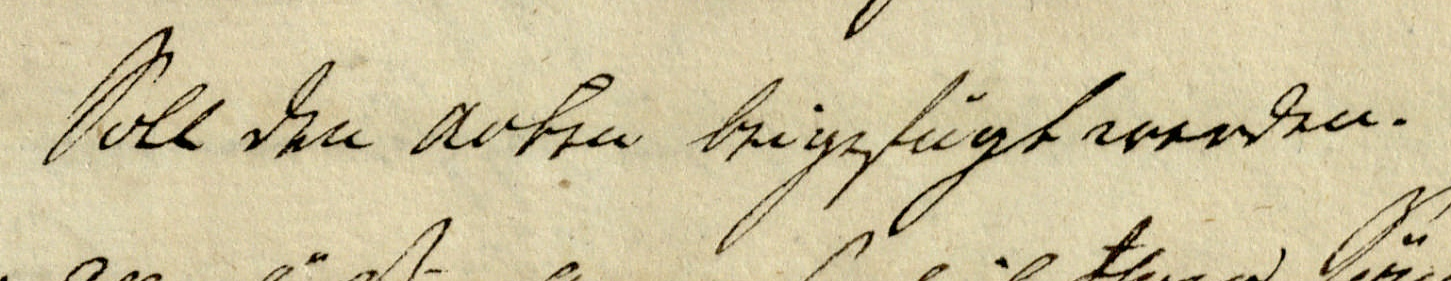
Soll den Acten beigefügt werden.
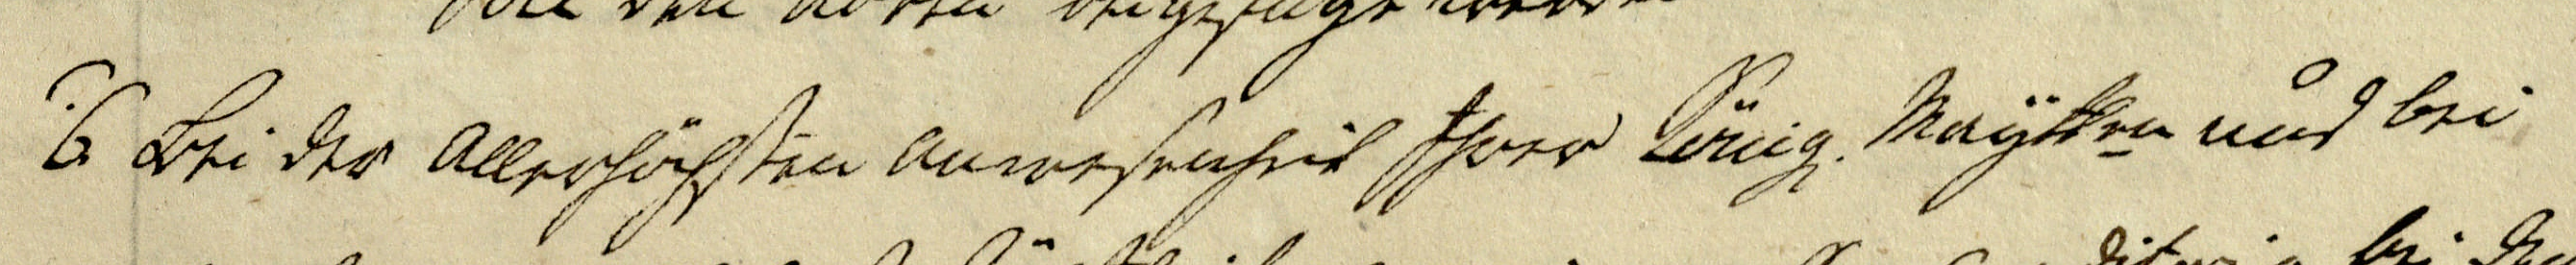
6. Bei des Allerhöchsten Anwesenheit Ihrer König. Maÿtten und bei
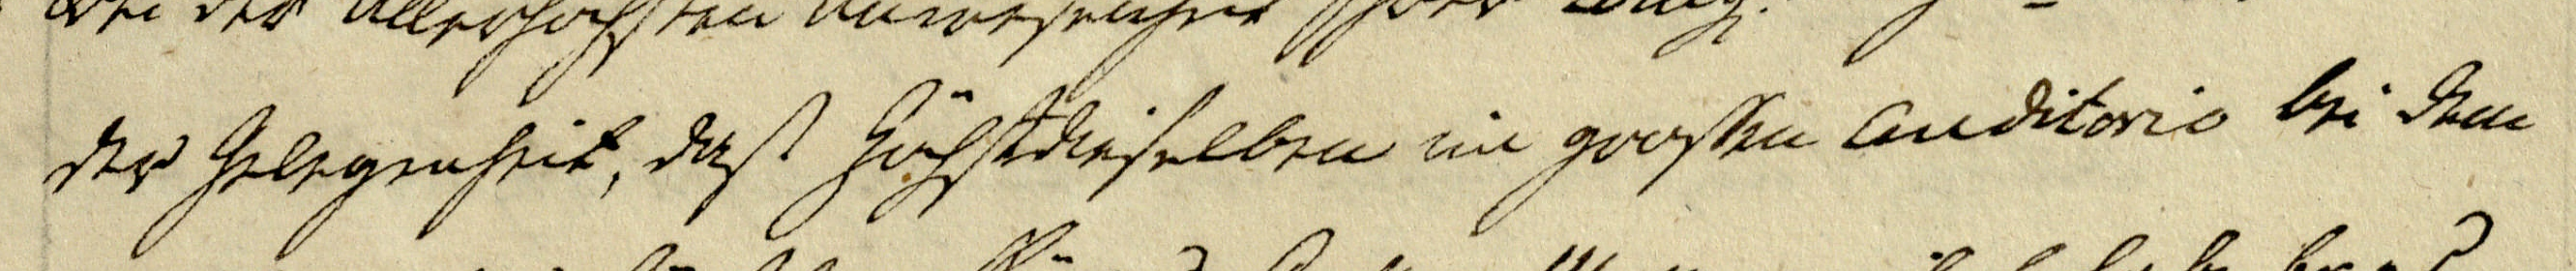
der Gelegenheit, daß Höchstdieselben im grossen Auditorio bei dem
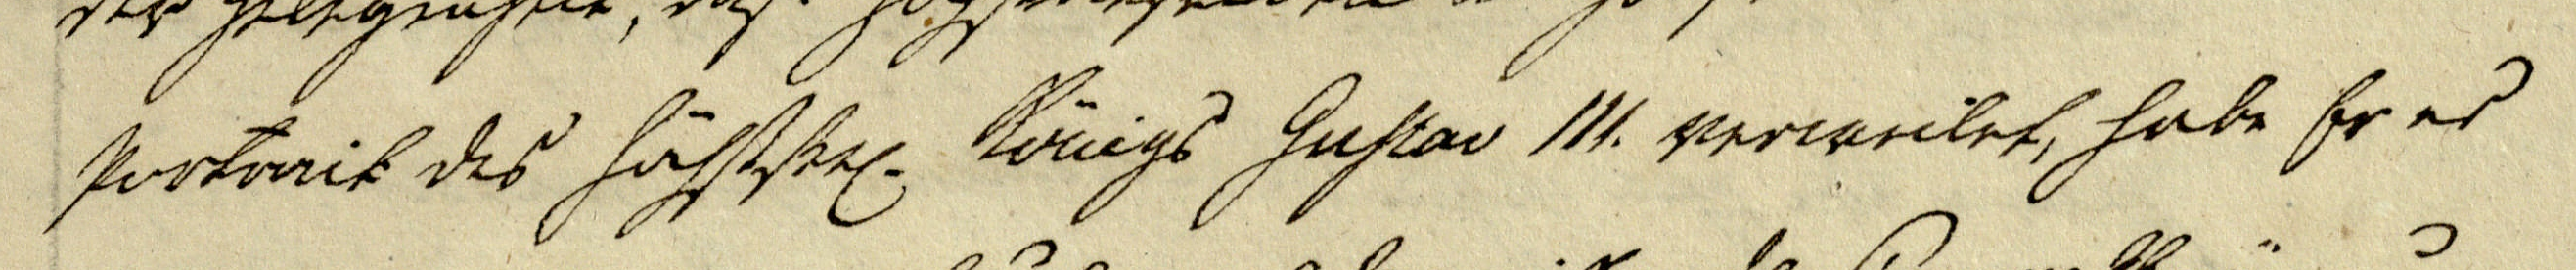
Portrait des höchstseel. Königs Gustav III. verweilet, habe Er es
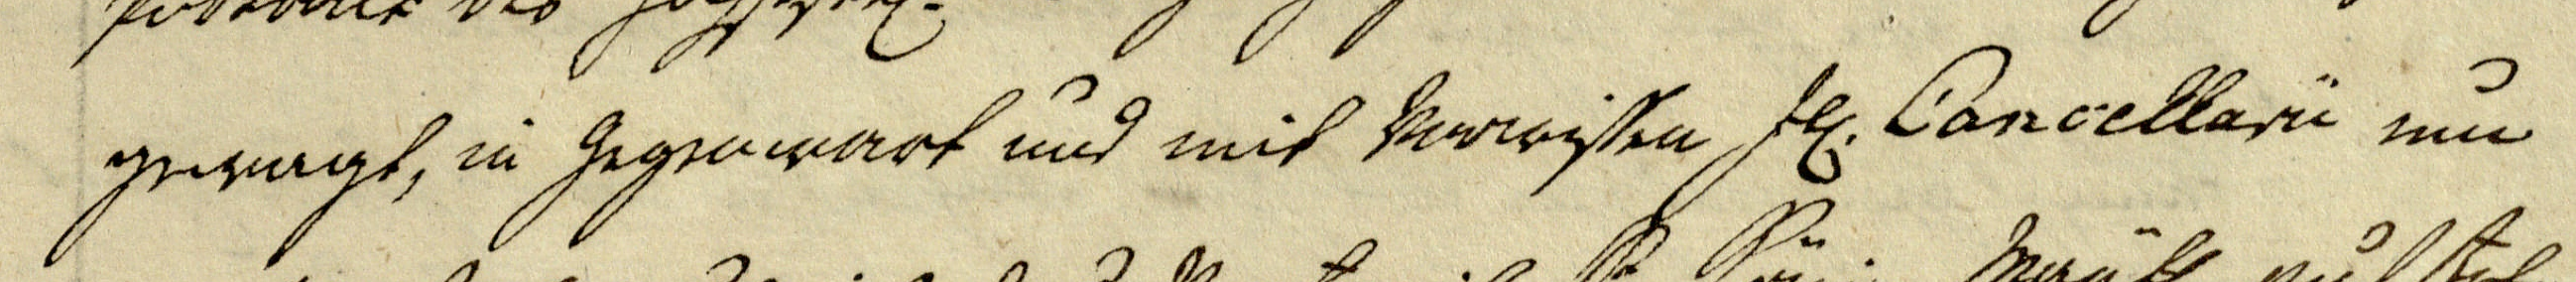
gewagt, in Gegenwart und mit Vorwissen Ill. Cancellarii um
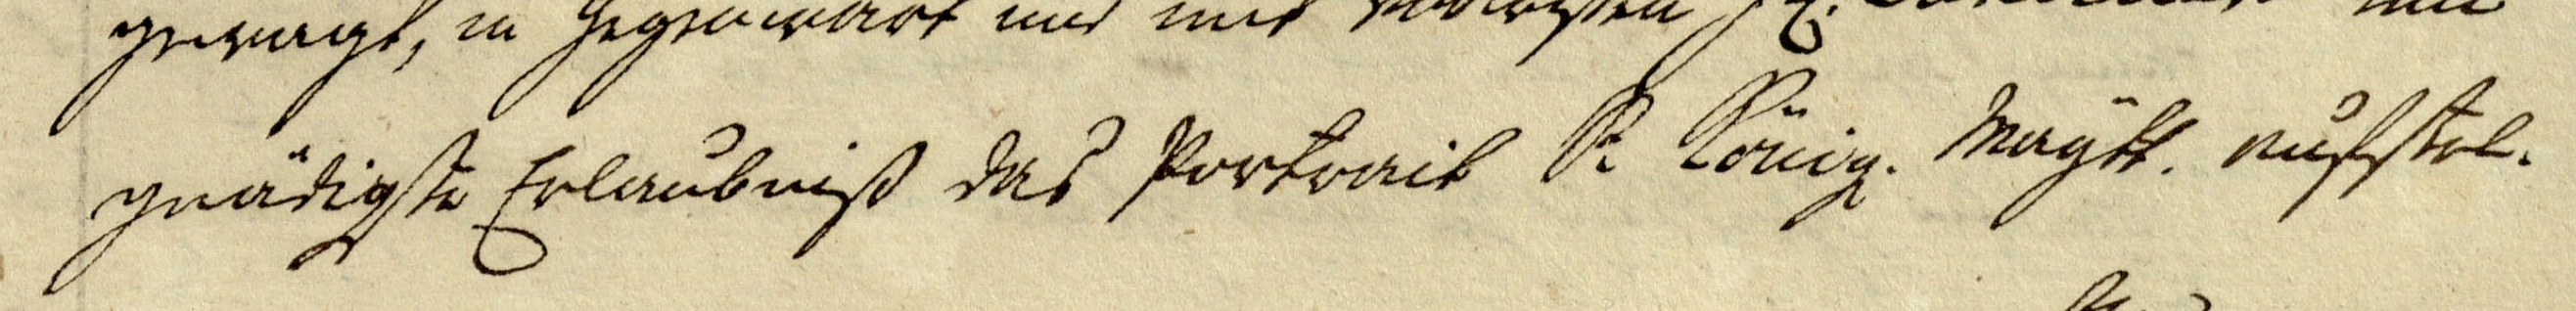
gnädigste Erlaubniß das Portrait Sr. König. Maÿtt. aufstel¬
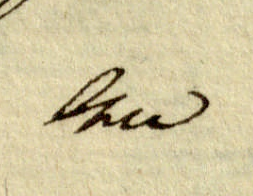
len
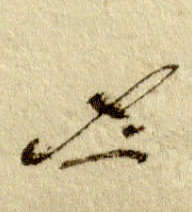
f.
